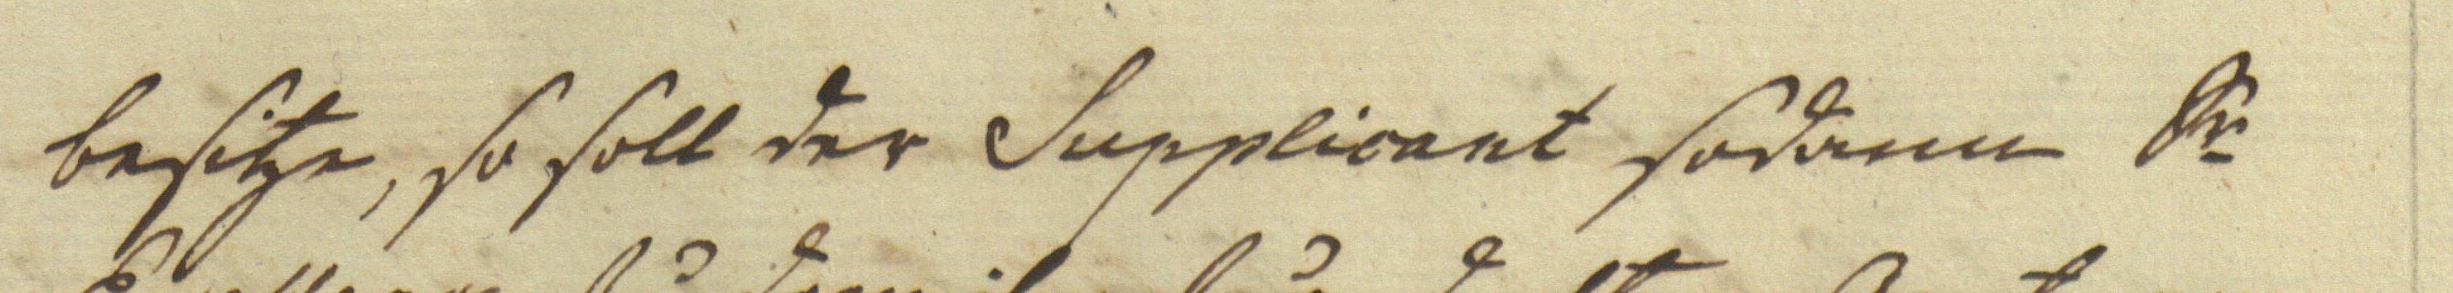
besitze, so soll der Supplicant sodann Sr
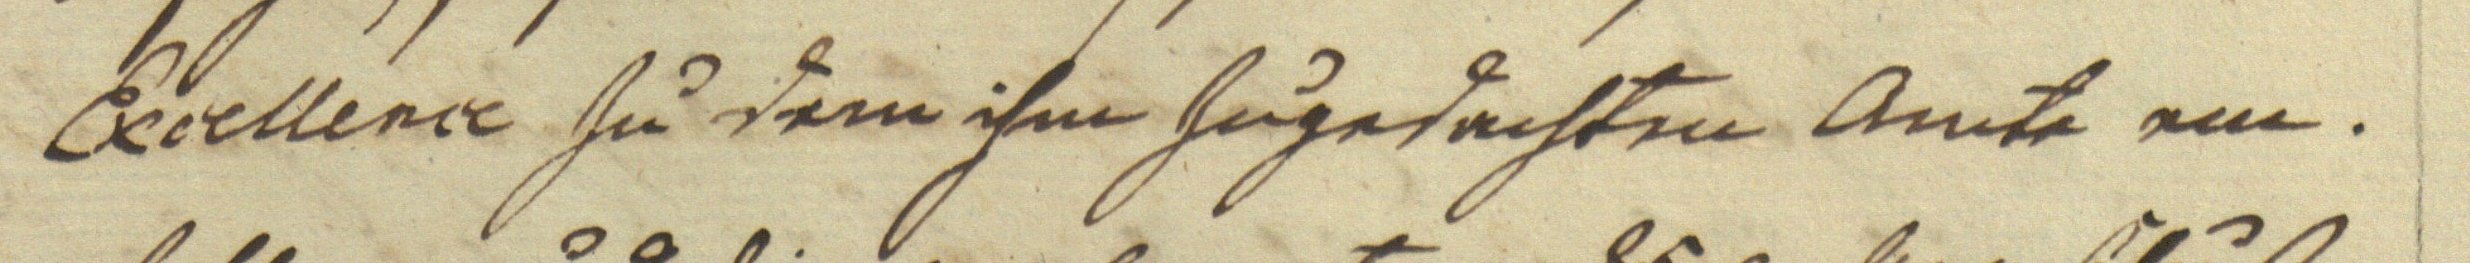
Excellence zu dem ihm zugedachten Amte em¬
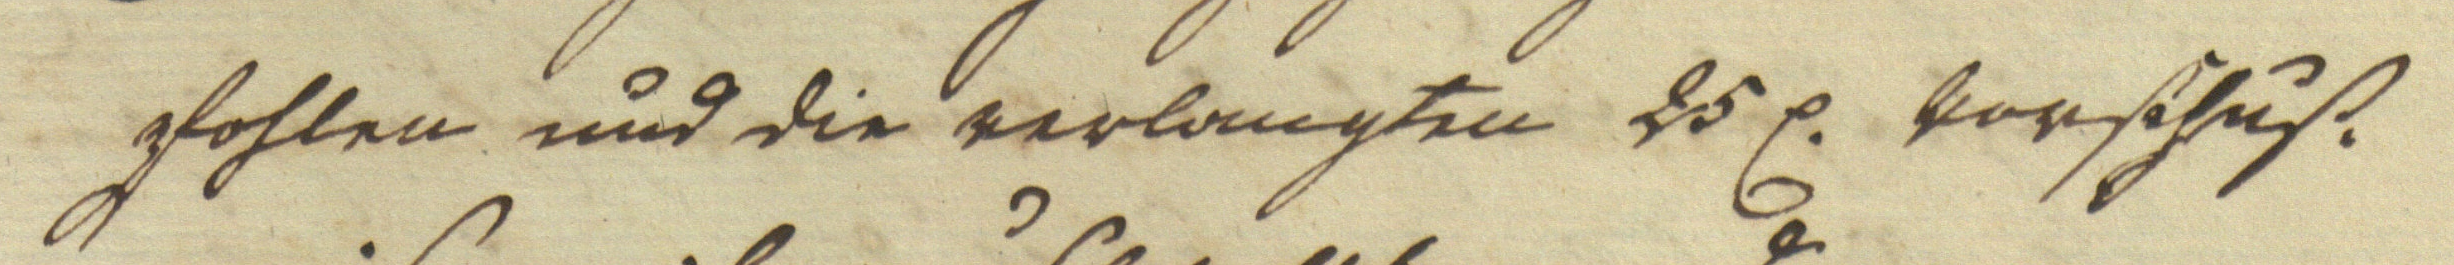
pfohlen und die verlangten 25 l. Vorschuß¬
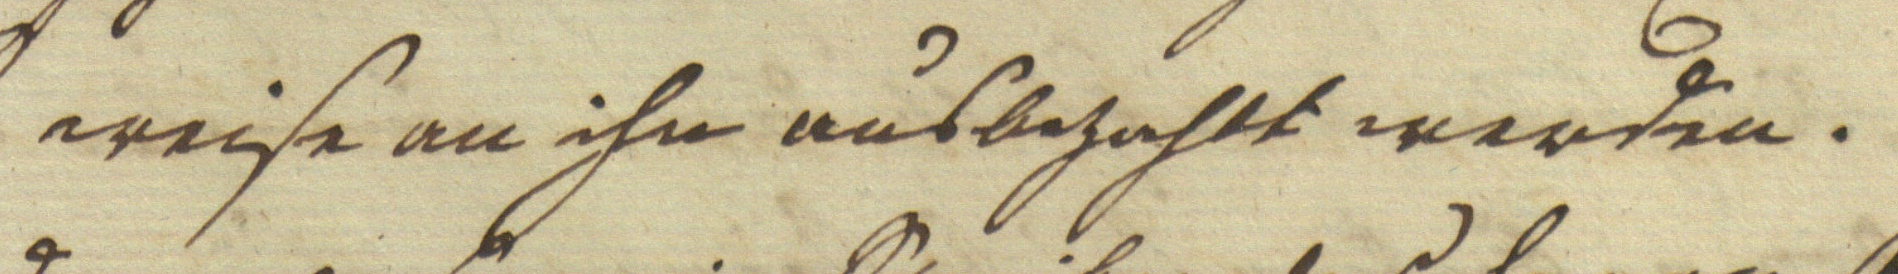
weise an ihn ausbezahlt werden.
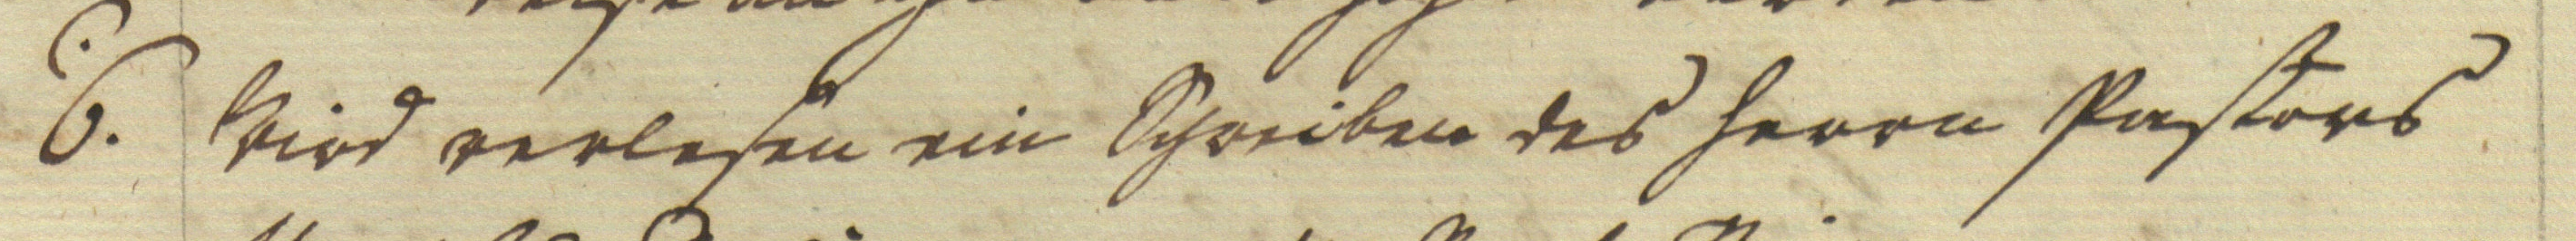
6. Wird verlesen ein Schreiben des Herrn Pastors
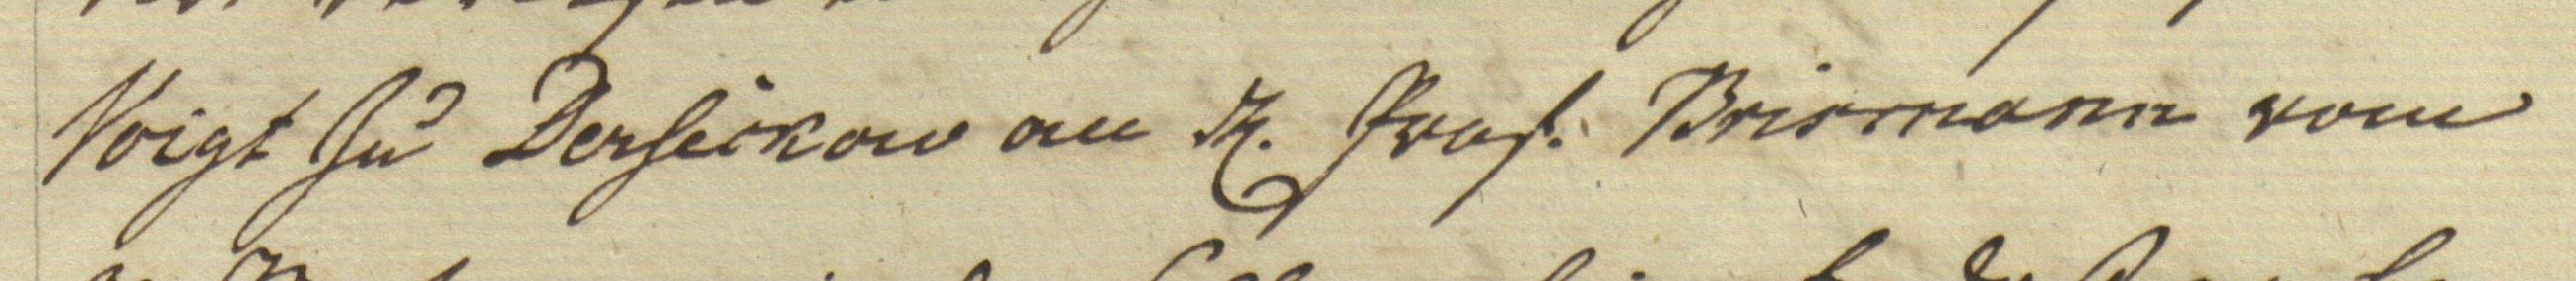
Voigt zu Derseckow an dh. Prof. Brismann vom
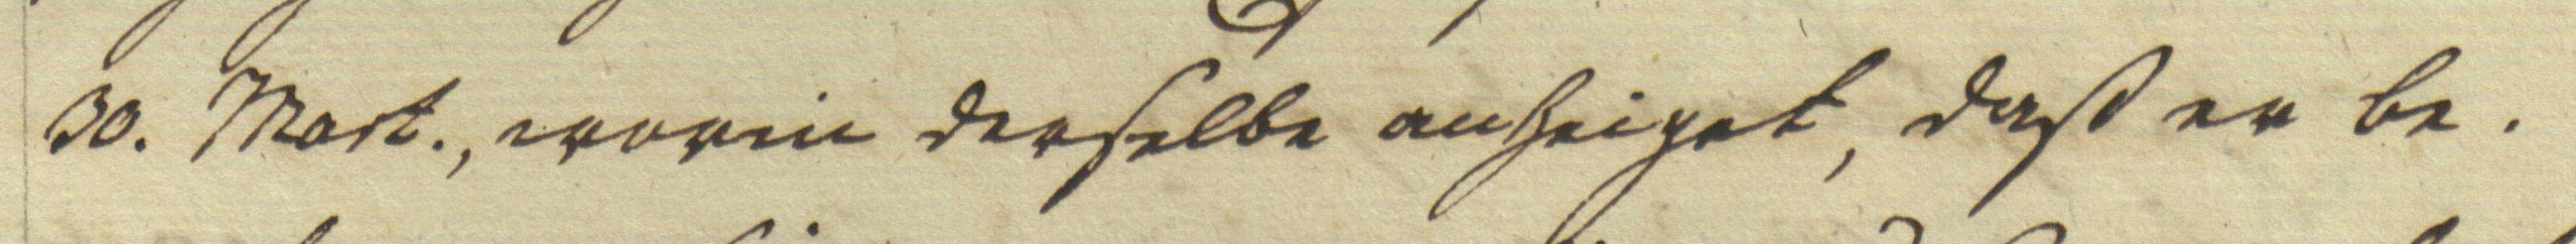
30. Mart. worin derselbe anzeiget, daß er be¬
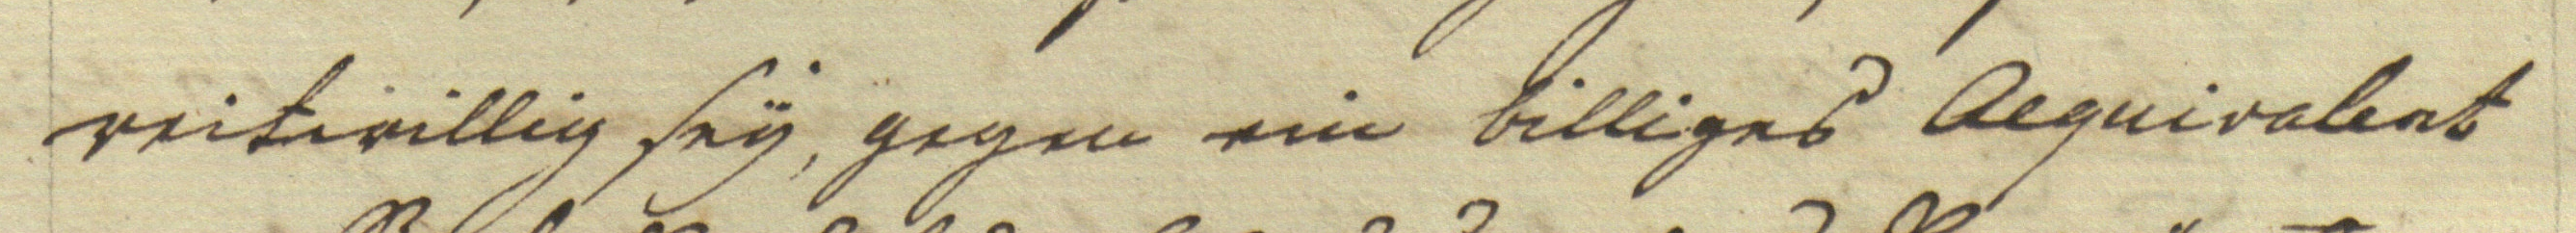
reitwillig seÿ, gegen ein billiges Aequivalent
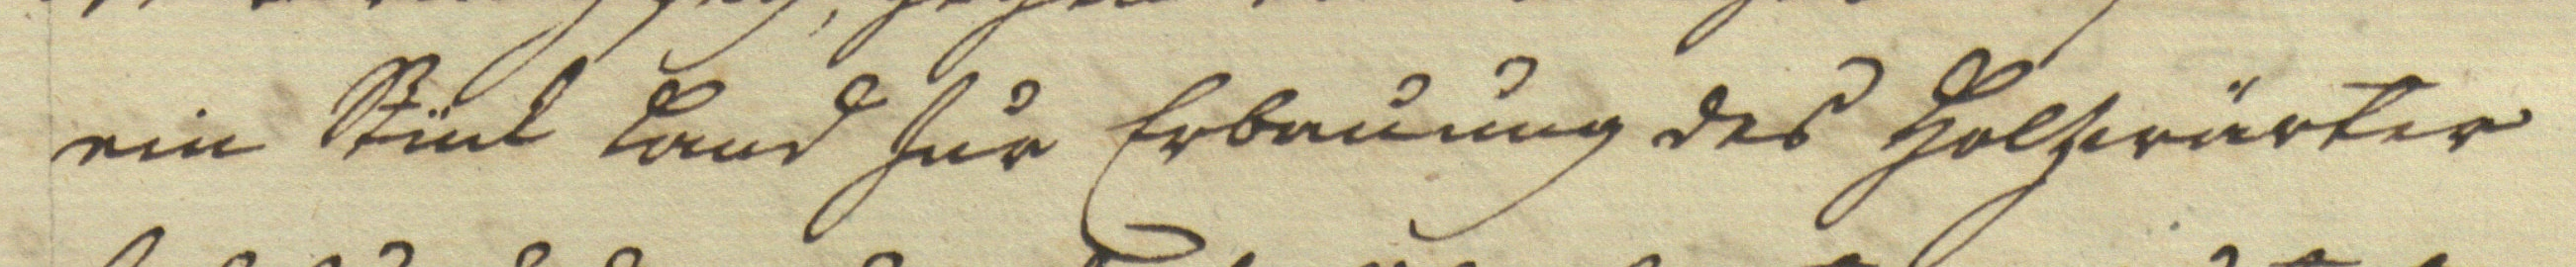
ein Stück Land zur Erbauung des Holzwärter¬
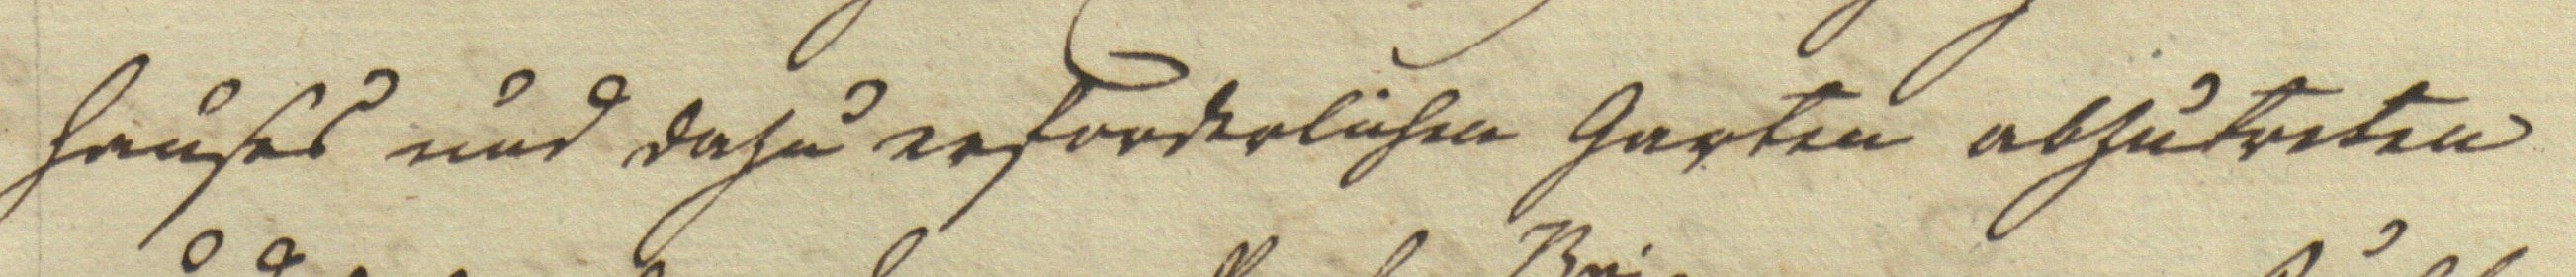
hauses und dazu erforderlichen Garten abzutreten
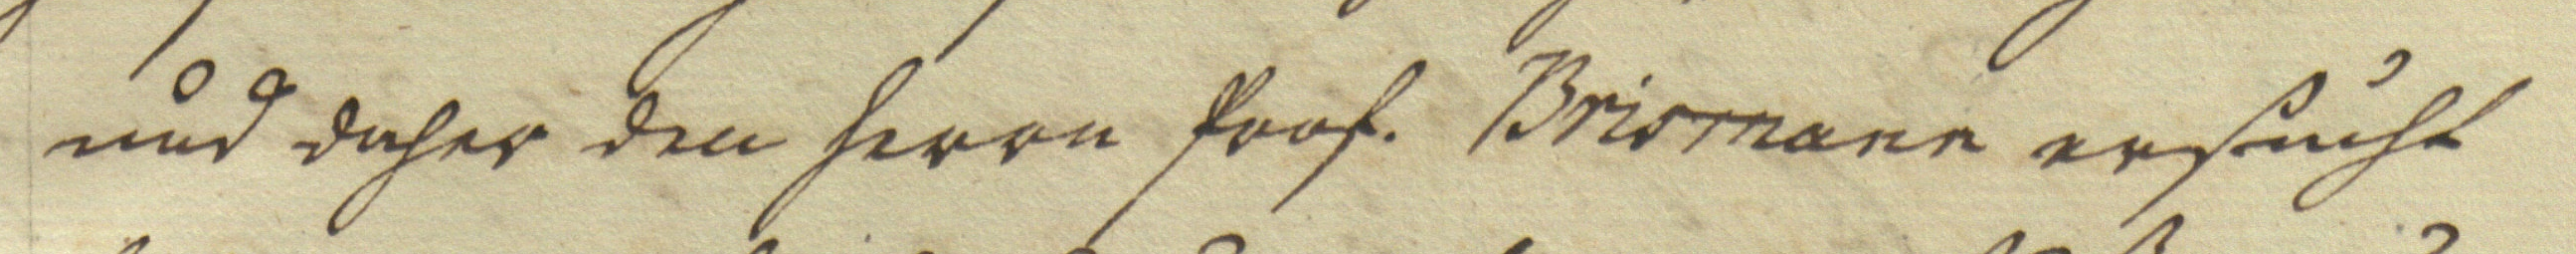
und daher den Herrn Prof. Brismann ersucht
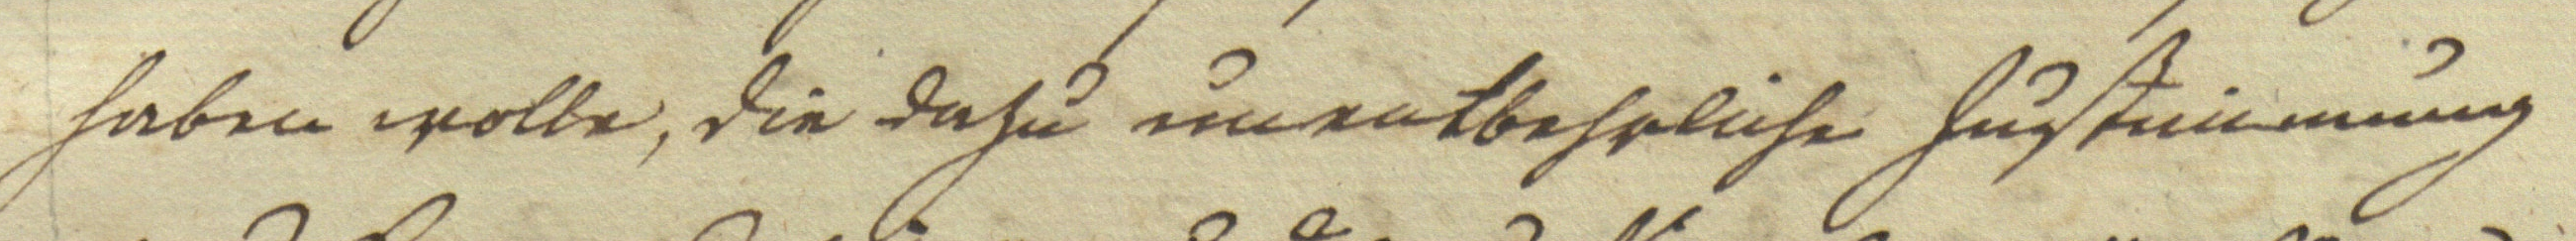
haben wolle, die dazu unentbehrliche Zustimmung
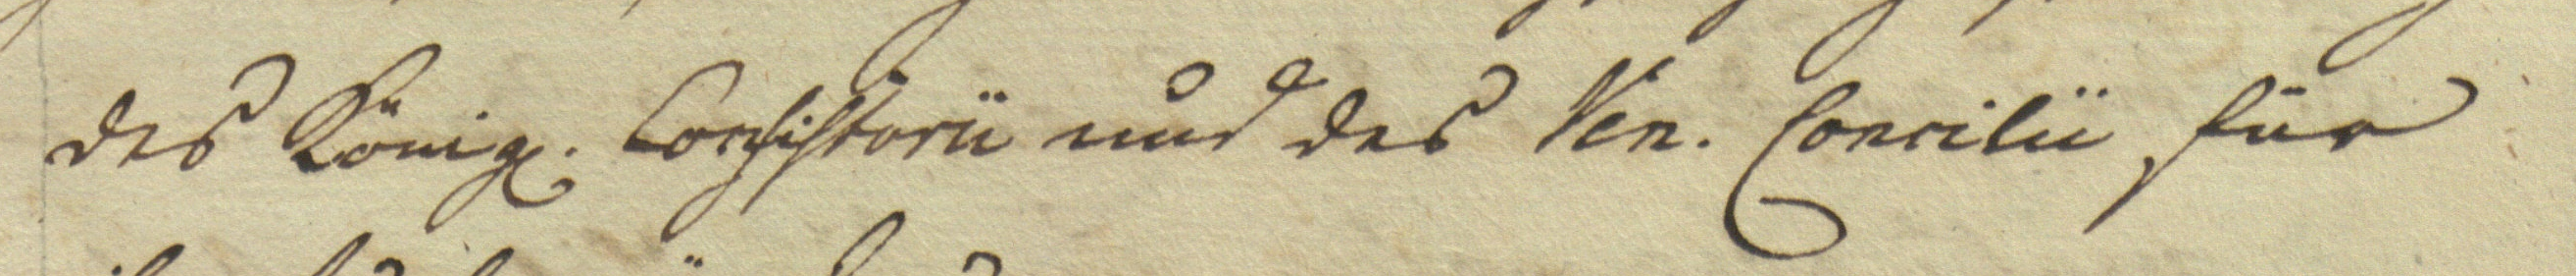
des Königl. Consistorii und des Ven. Concilii für
